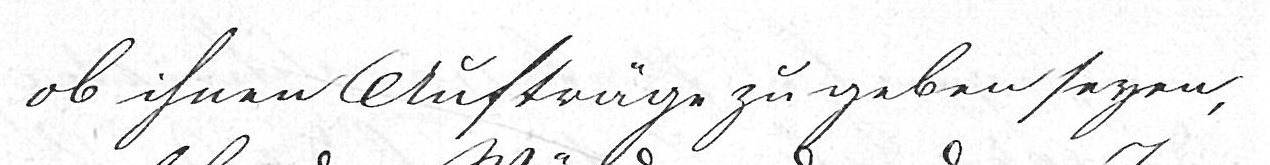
ob ihnen Aufträge zu geben seyen,
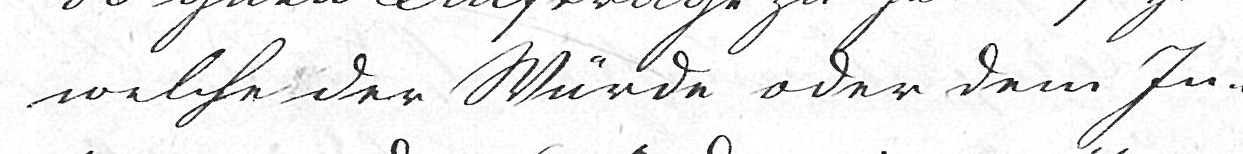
welche der Würde oder dem In-
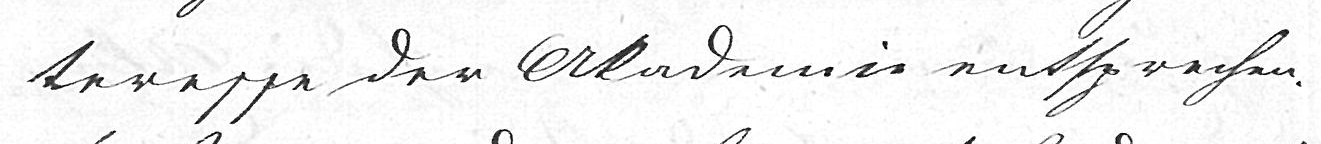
teresse der Akademie entsprechen.
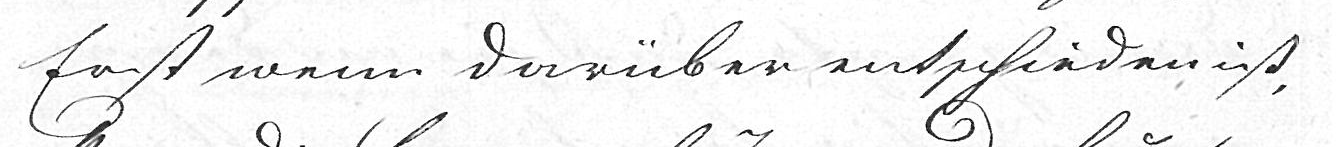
Erst wenn darüber entschieden ist,
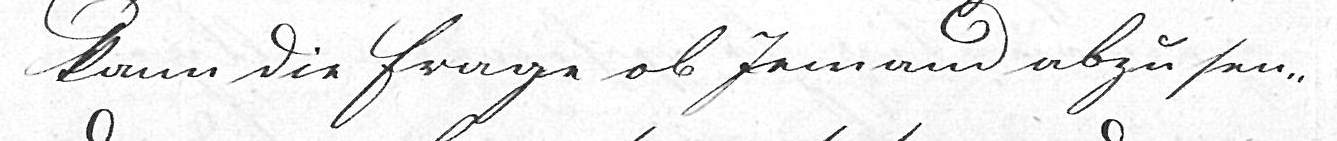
kann die Frage ob jemand abzusen-
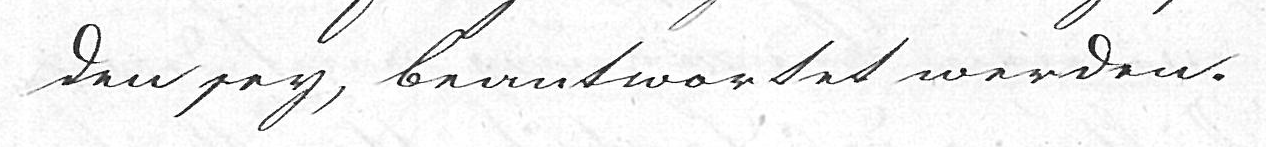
den sey, beantwortet werden.
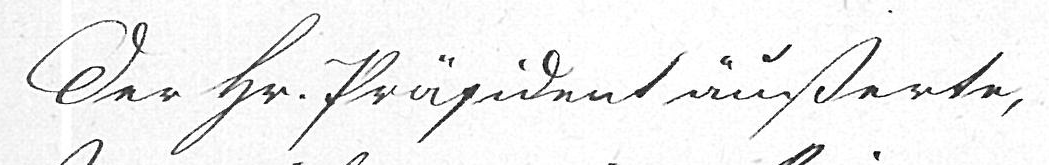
Der Hr. Präsident äußerte,
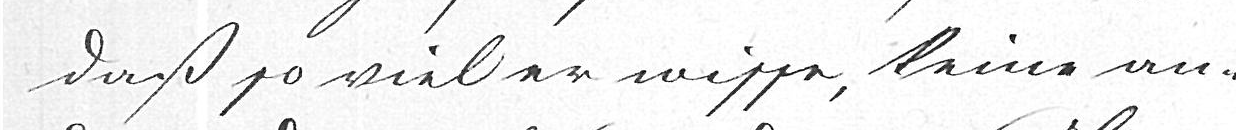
daß so viel er wisse, keine an-
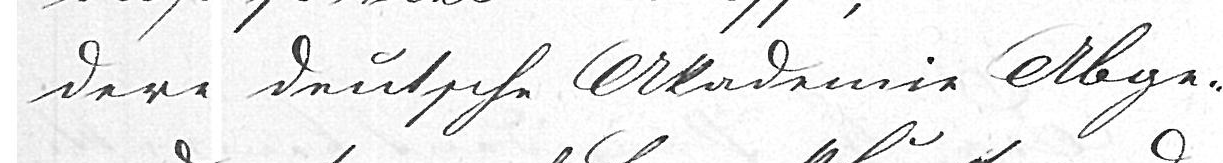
dere deutsche Akademie Abge-
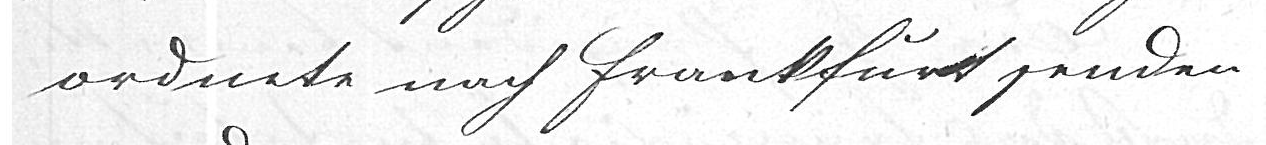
ordnete noch Frankfurt senden
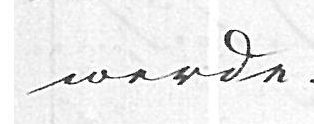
werde.
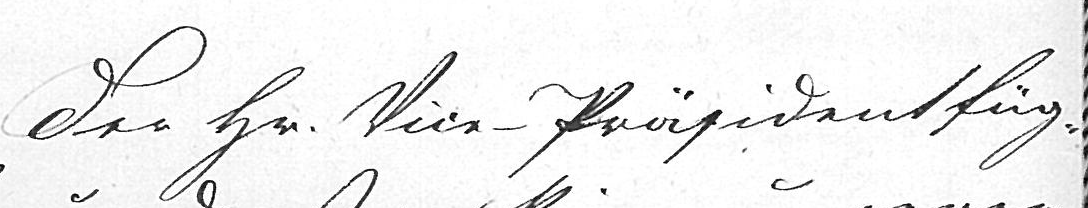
Der Hr Vice-Präsident füg-
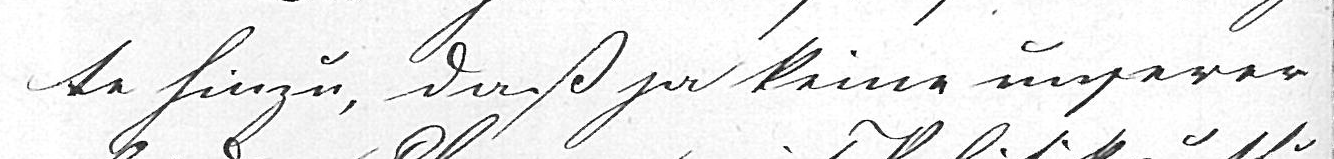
te hinzu, daß ja keine unserer
